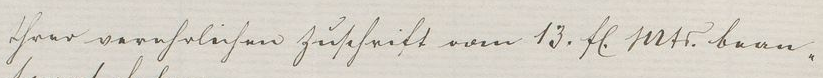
Ihrer verehrlichen Zuschrift vom 13.fl. Mts. bean-
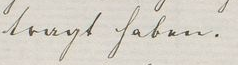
tragt haben.
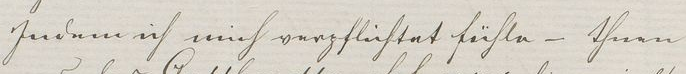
Indem ich mich verpflichtet fühle – Ihnen
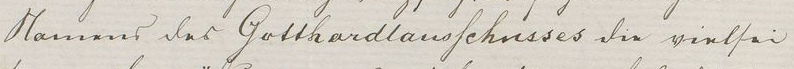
Namens des Gotthardtausschusses die vielsei-
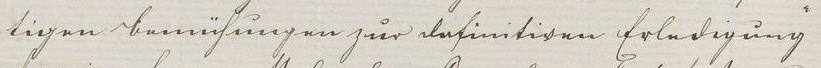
tigen Bemühungen zur definitiven Erledigung
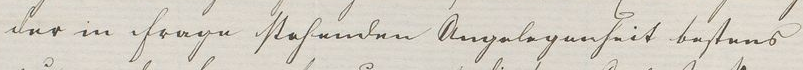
der in Frage stehenden Angelegenheit bestens
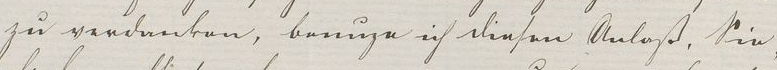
zu verdanken, benuze ich diesen Anlass, Sie,
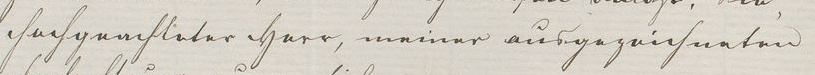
hochgeachteter Herr, meiner ausgezeichneten
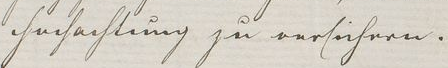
Hochachtung zu versichern.
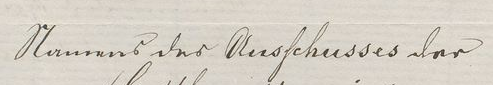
Namens des Ausschusses der
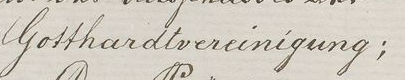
Gotthardtvereinigung;
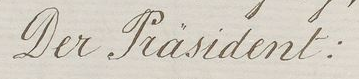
Der Präsident:
